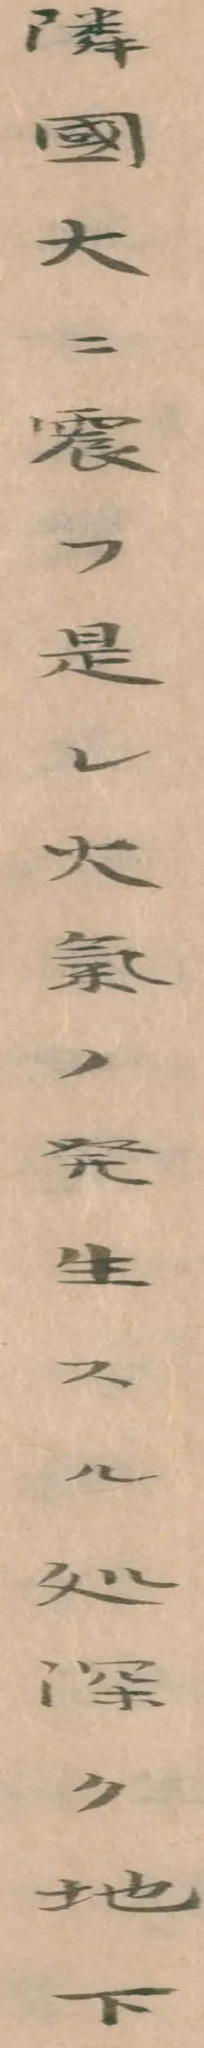隣国大二震フ是レ火気ノ発生スル処深ク地下
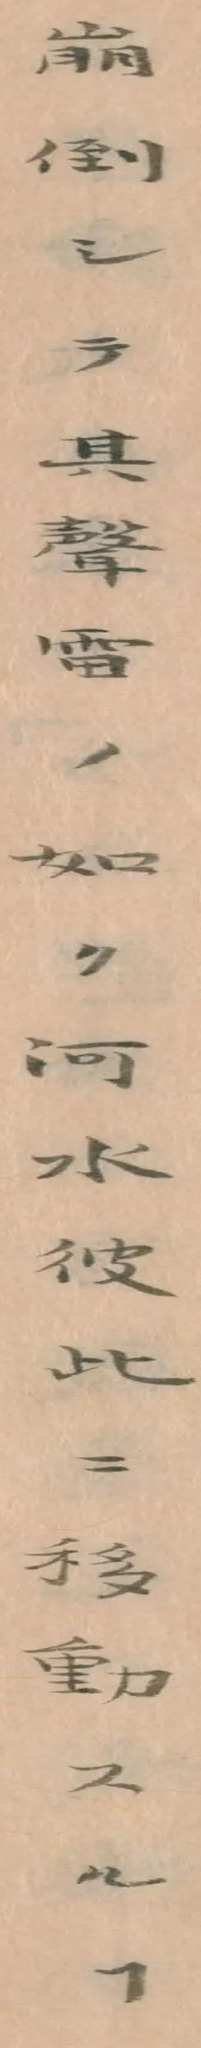崩倒シテ其声雷ノ如ク河水彼此二移動スルコト
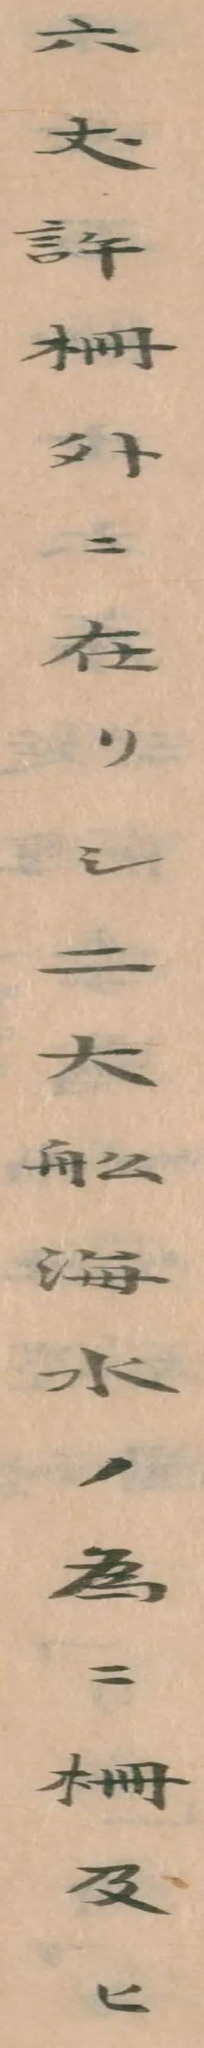六丈許柵外二在りシ二大船海水ノ為二柵及ヒ
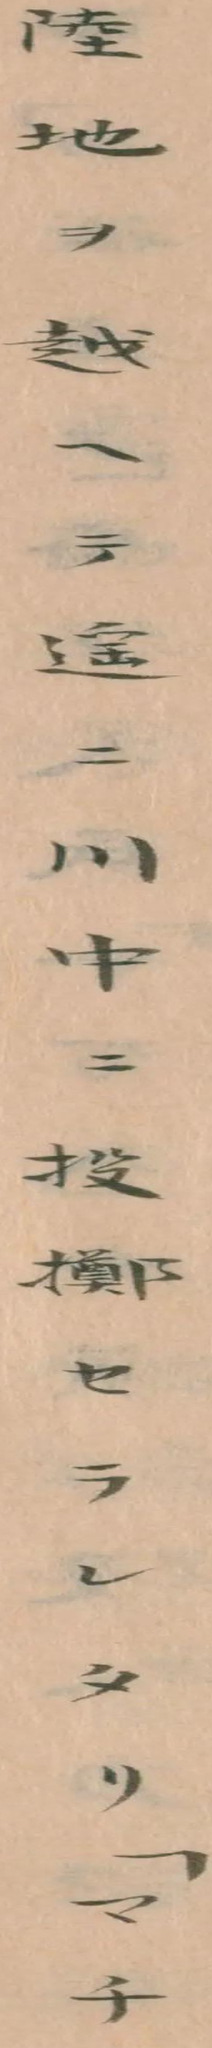陸地ヲ越ヘテ遥二川中二当擲セラレタリ「マチ
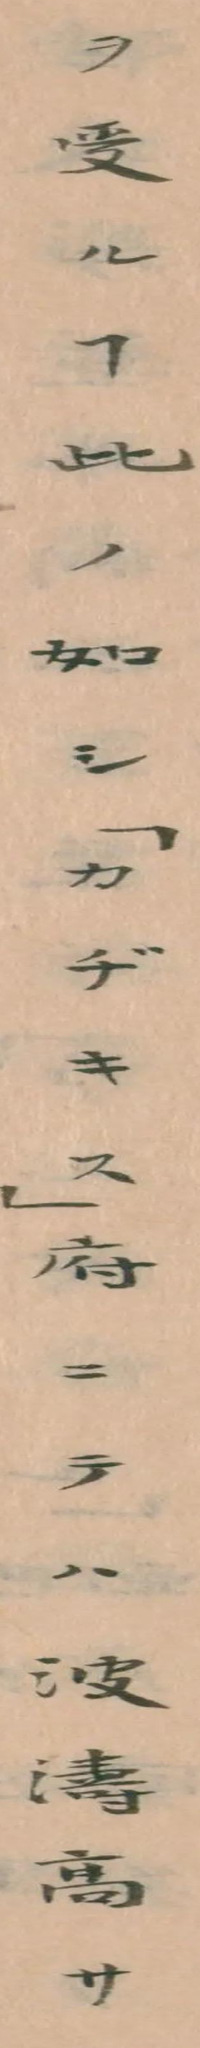ヲ受ㇽコト此ノ如シ「カヂキス」府二テハ波濤高サ
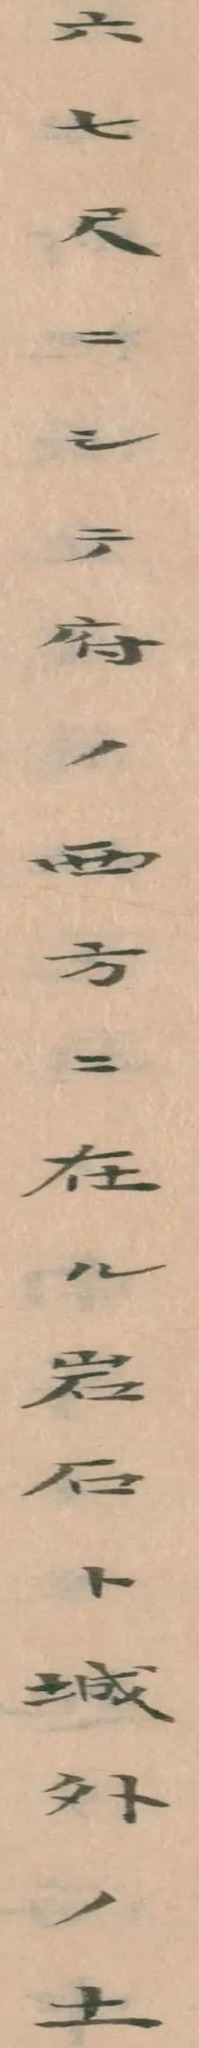六七尺二シテ府ノ西方二在ㇽ岩石ト城外ノ土
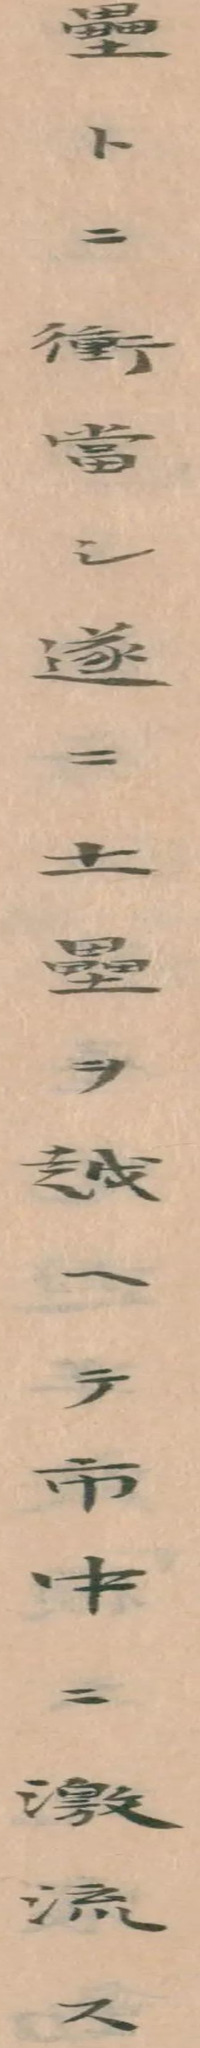塁トニ衝当シ遂二土塁ヲ越ヘテ市中二激流ス
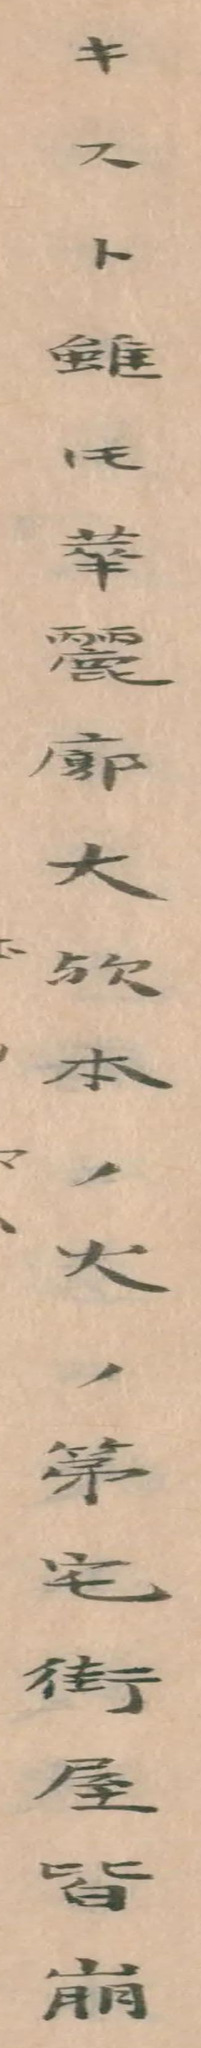キスト雖トモ華麗廊大加本ノ火ノ大第宅街屋皆崩
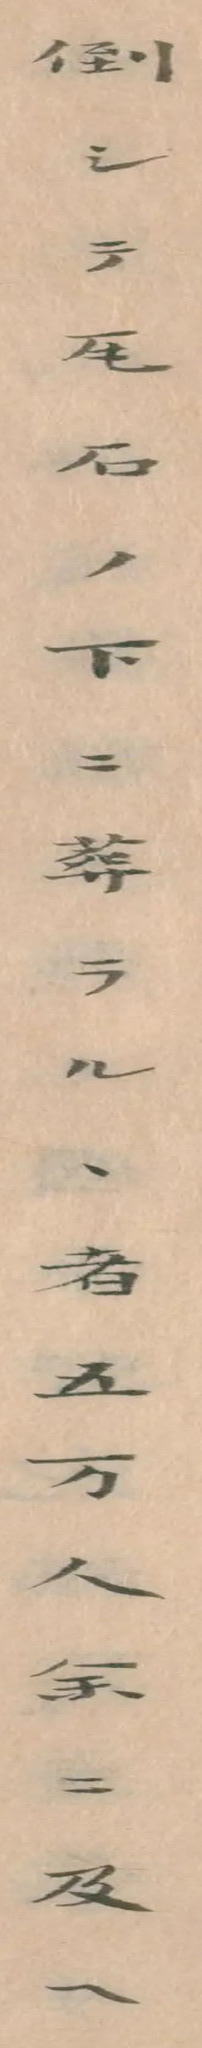倒シ手瓦石ノ下二そう葬ラㇽゝ者五万人余二及へ
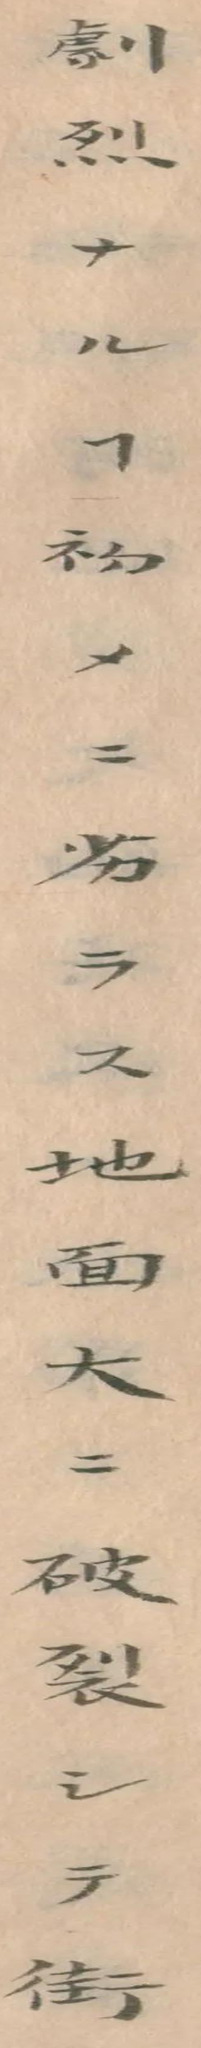激烈ンナルコト初メニ劣ラス地面大二破裂シテ街
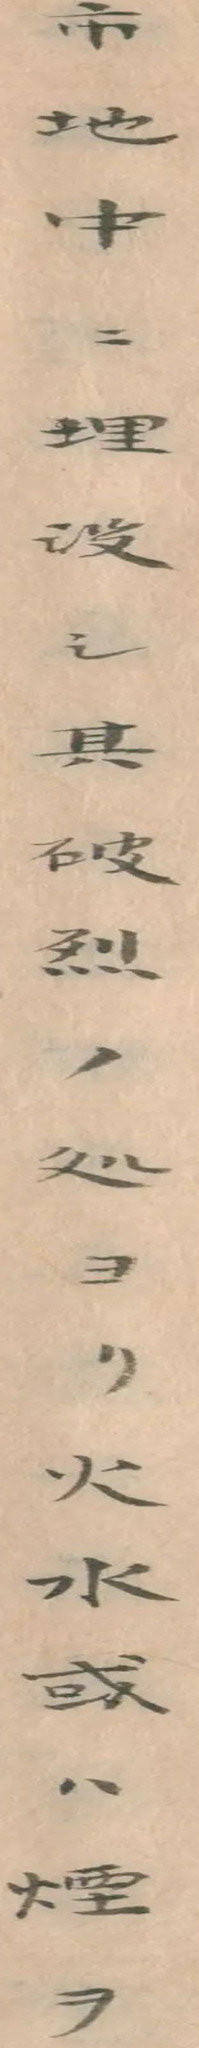市地中二埋没シ其破裂ノ処ヨリ火水或ハ煙ヲ

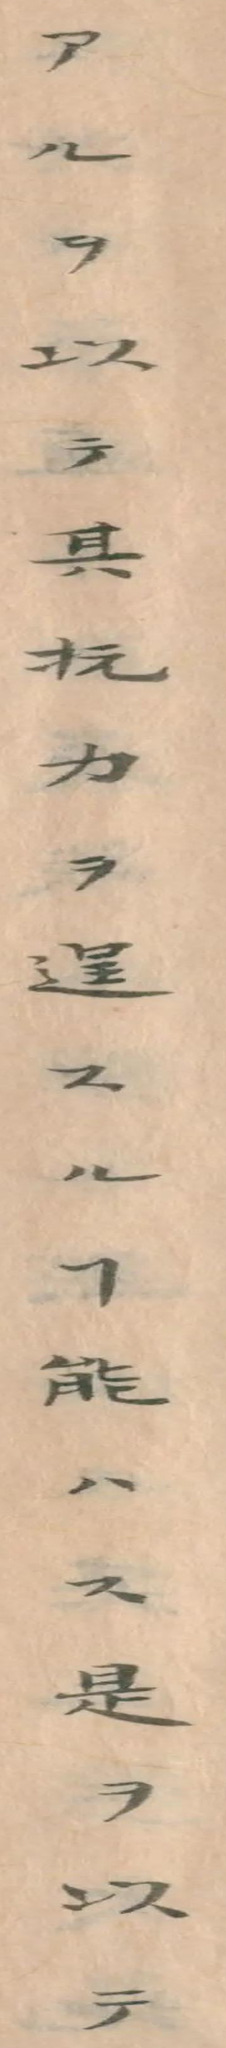アルヲ以テ其抗力ヲ逞スルコト能ハス是ヲ以テ
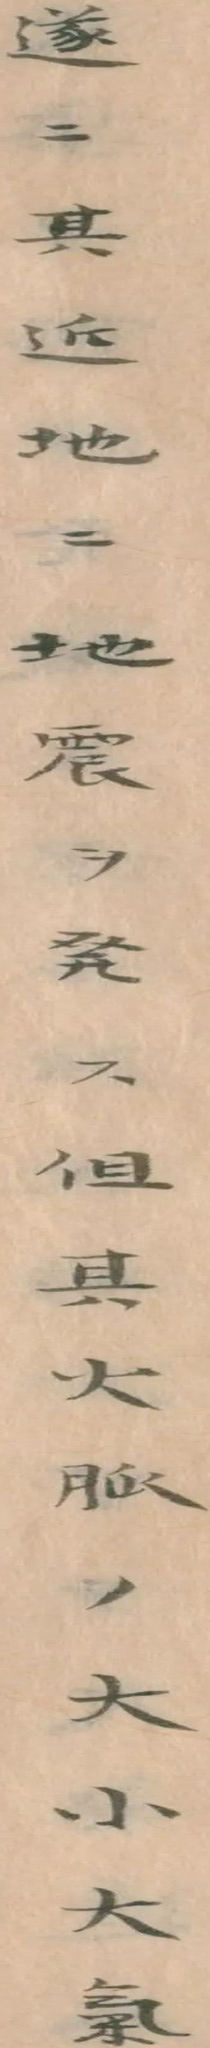遂二其近地二地震ヲ発ス但其火脈ヲ大小大気
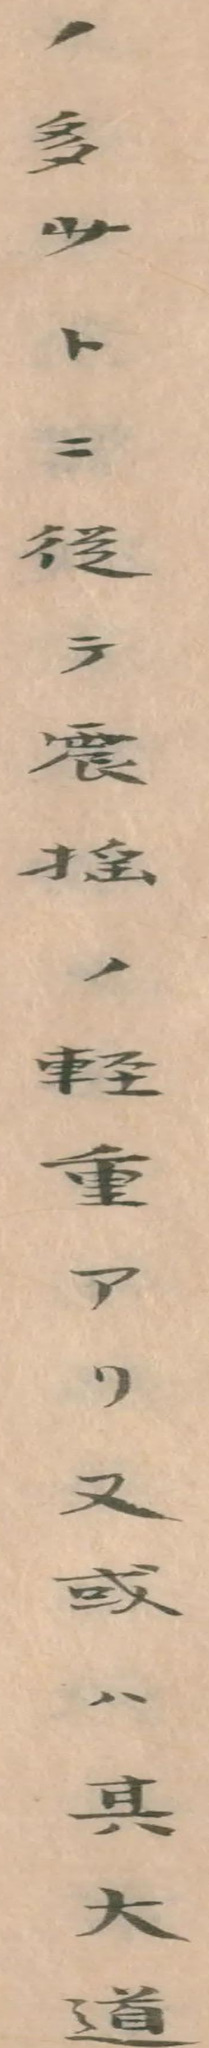ノ多少トニ従テ震揺ノ軽重アリ又或ハ其大道
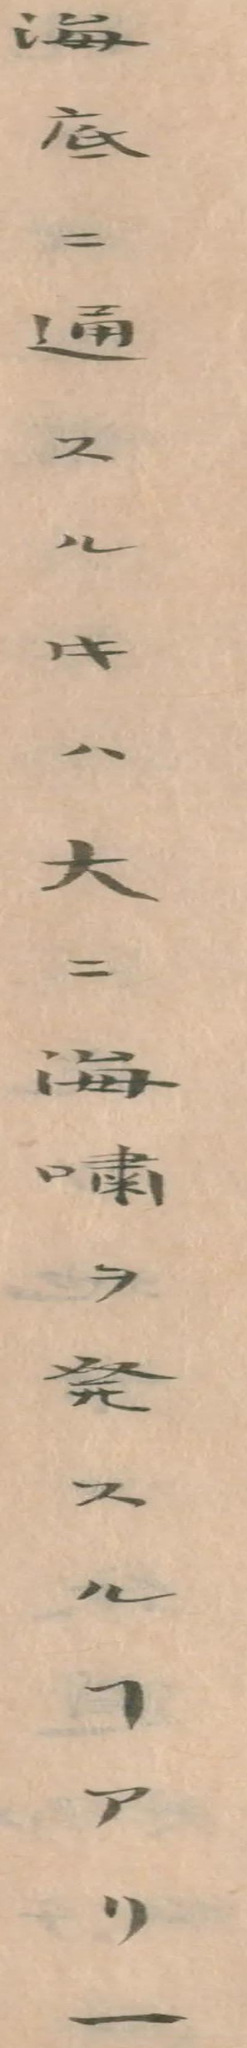海底二通スルトキハ大二海嘯ヲ発スルコトアリ一
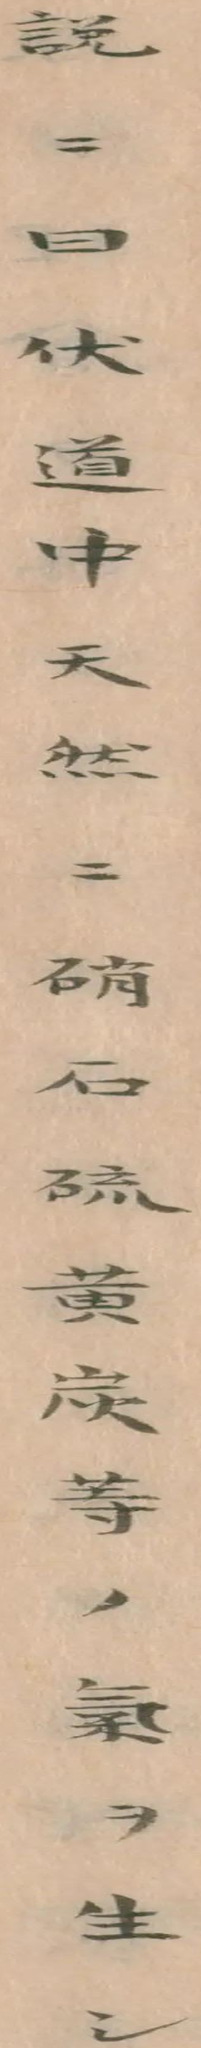説二曰伏道中二天然二硝石硫黄炭等ノ気ヲ生シ
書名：地災撮要. 巻1(噴火山・地震ノ部)
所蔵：国立国会図書館 National Diet Library, JAPAN
